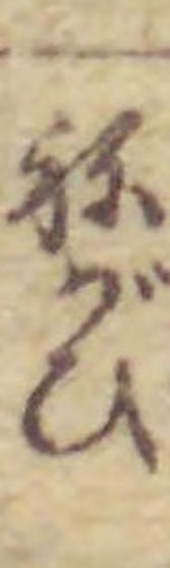ねがひ
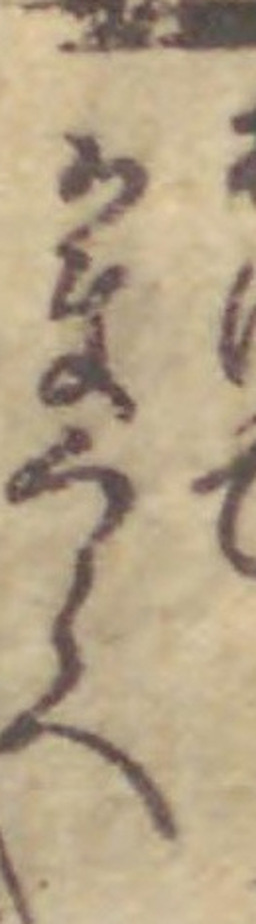かまくらへ
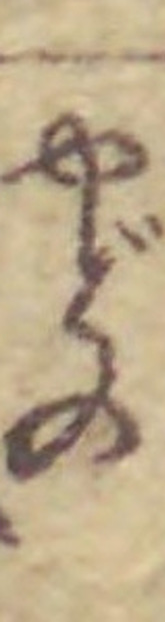やどの
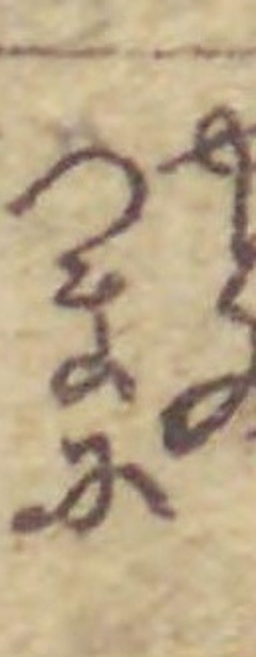つまに
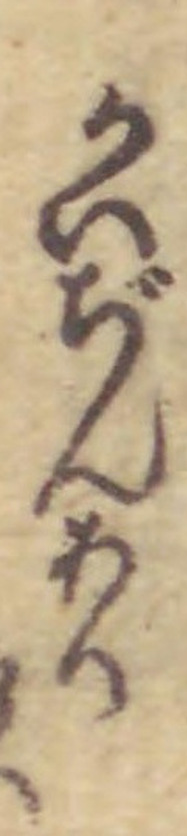かいぢんあり
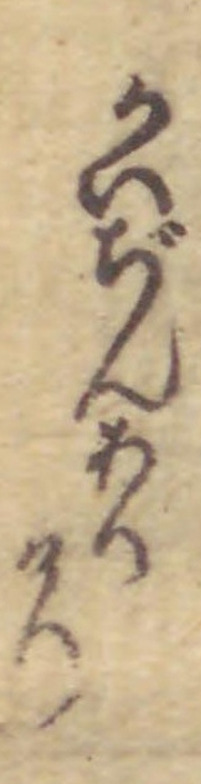かいぢんあり

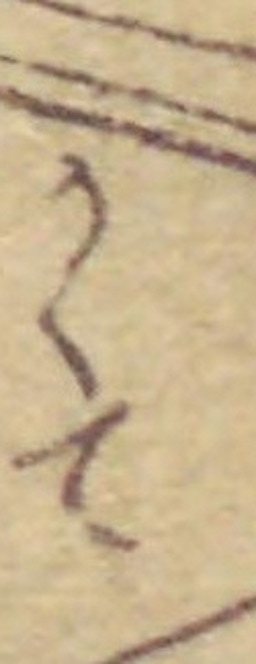かくて
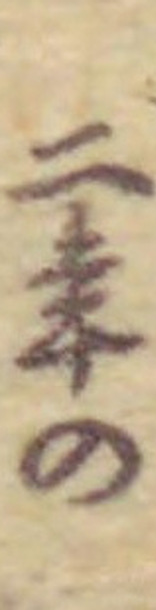二年の
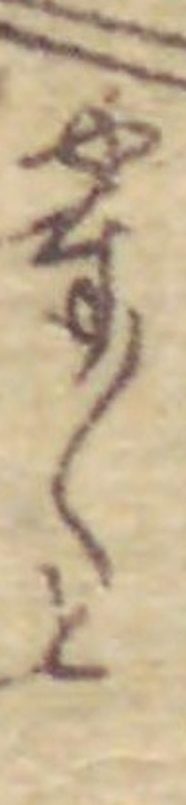やす〳〵と
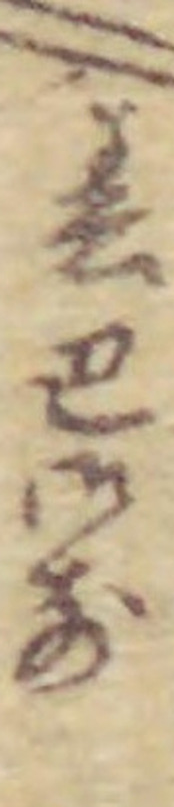春巴御前
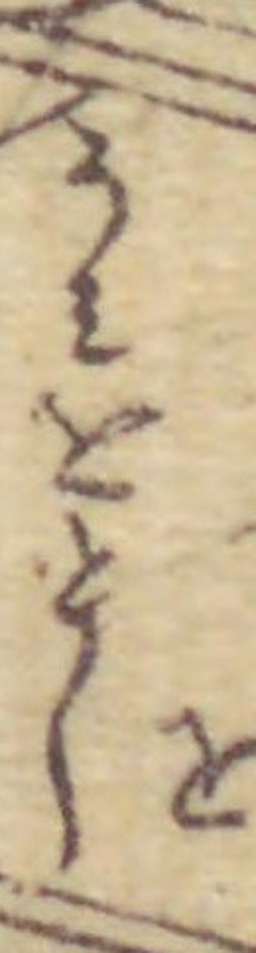うみをとし
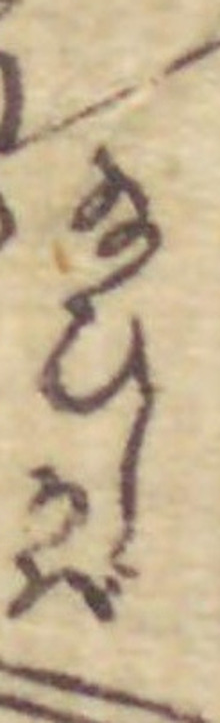給ひしかば
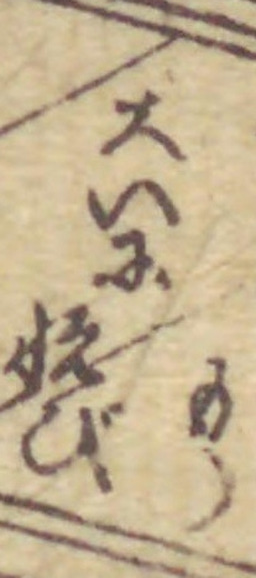大いに悦び
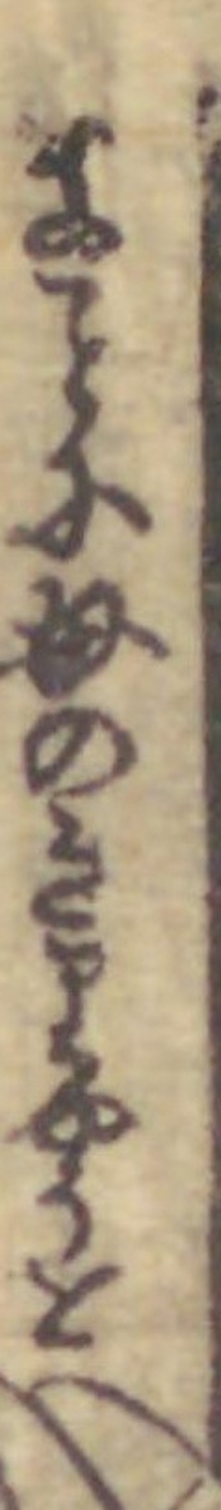まことに母のきりやうを
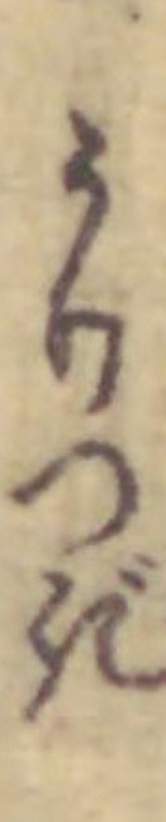うけつぎ
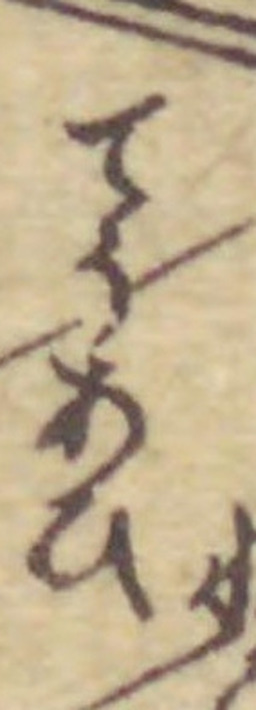てうあひ
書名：朝比奈草摺実記 2巻
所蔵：国立国会図書館 National Diet Library, JAPAN
